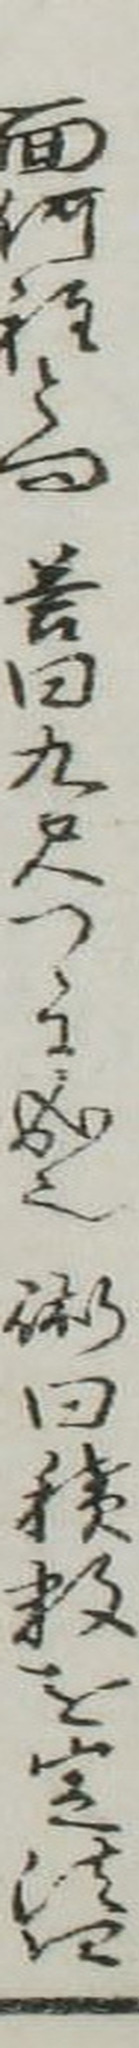同同面何程と問答曰九尺つゝに成也術曰積数を定法四
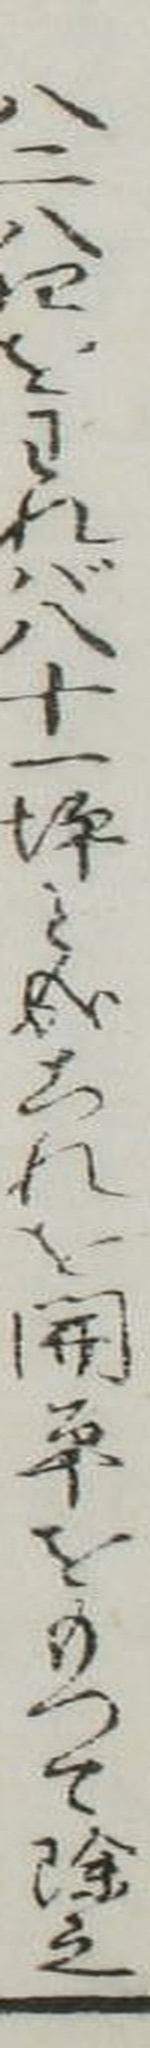同同八二八四をわれば八十一坪と成これを開平をもつて徐之
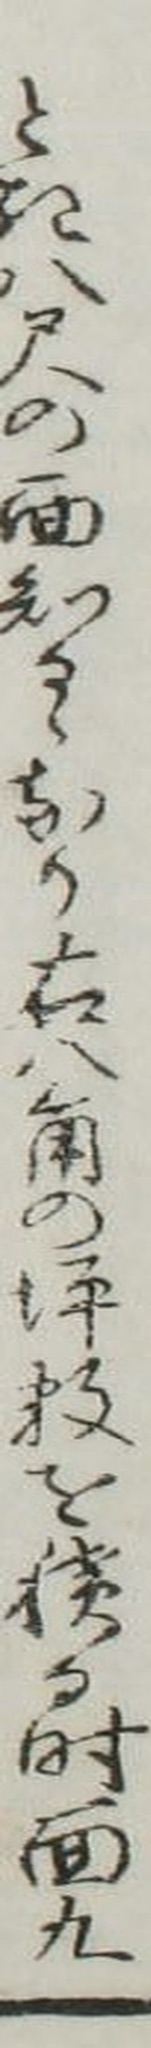同同とき八尺の面知るゝなり右八角の坪数を積る時面九
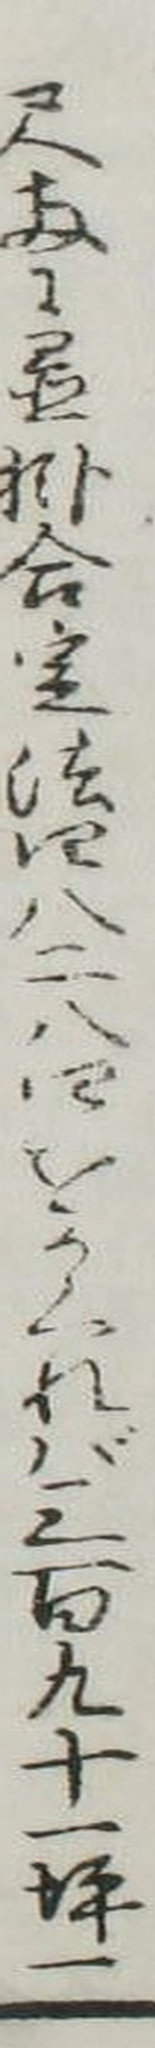同尺両に置掛合定法四八二八四をかくれば三百九十坪一
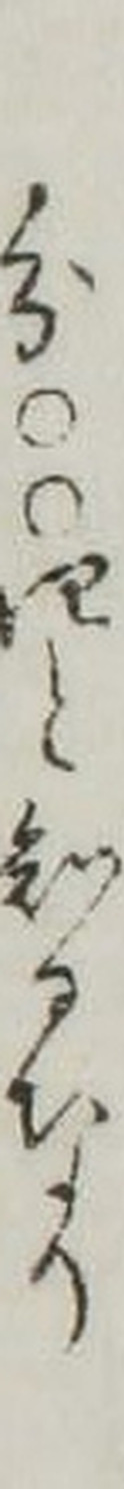分〇〇四と知るなり
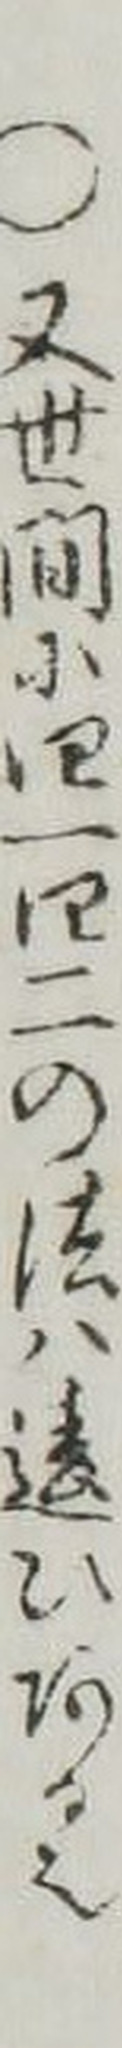○又世間に四一四二の法は違ひある也
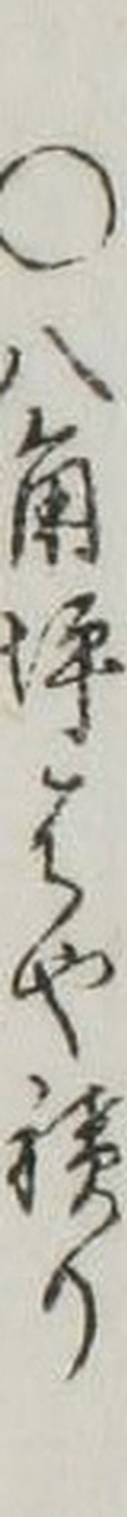○八角坪はや積り
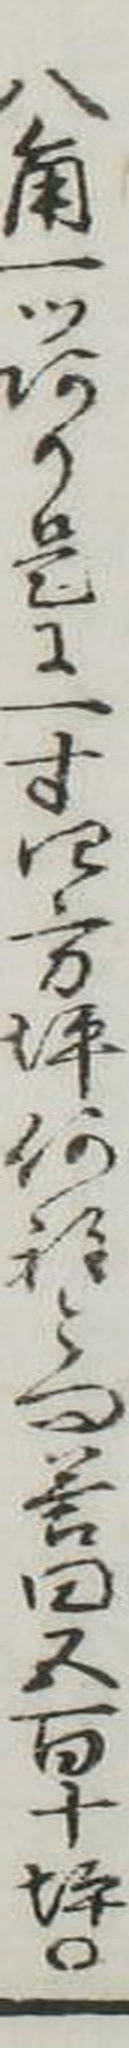一尺九寸八角一ツあり是に一寸四方坪何程と問答曰五百十坪〇
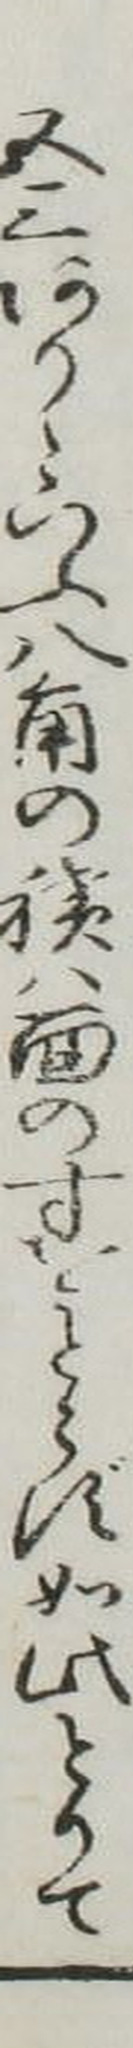五三ありといふ八角の積は面の寸をとらず如此とりて
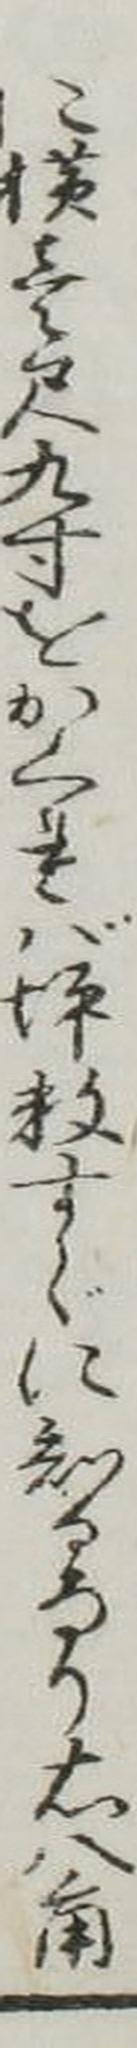に横壱尺九寸をかくれば坪数すぐに知るなり右八角
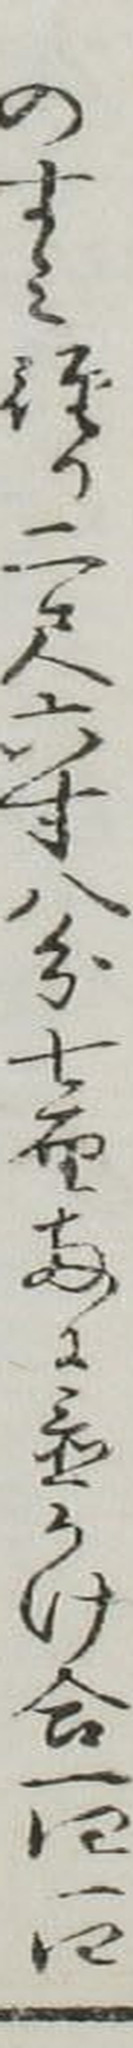のすみ径り二尺六寸八分七厘両に置かけ合一四一四
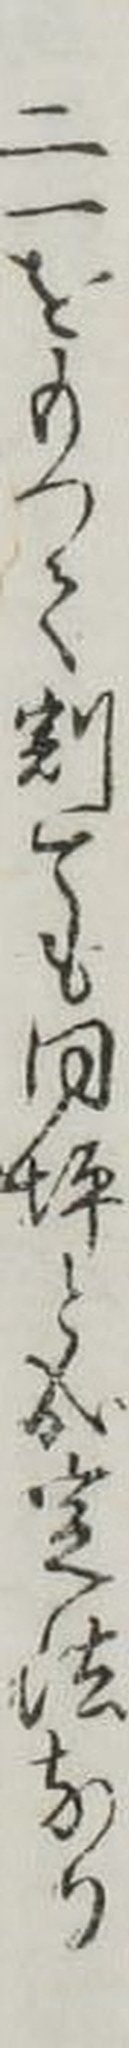二一をもつて割ても同坪と成定法なり
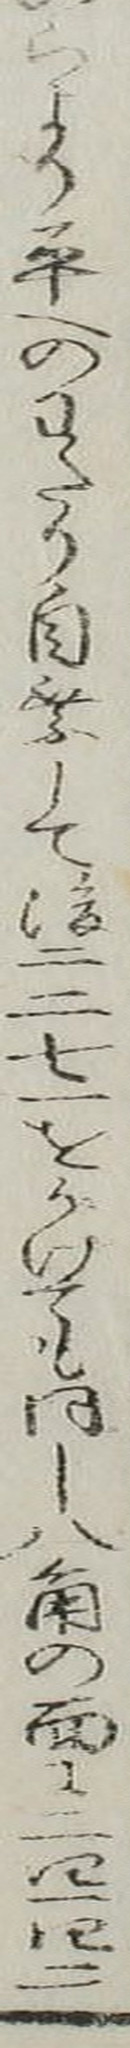又ひらより平へのわたり自乗して後二二七一をかけても同し八角の面に二四一四二
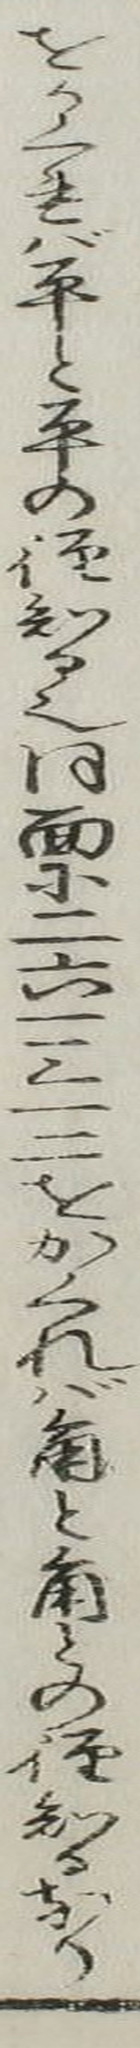をかくれば平と平の径知る也同面に二六一三一二をかくれば角と角との径知るなり
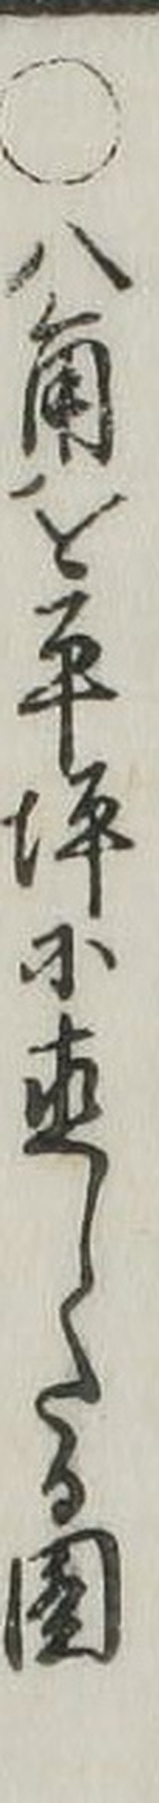○八角を平坪に直したる図
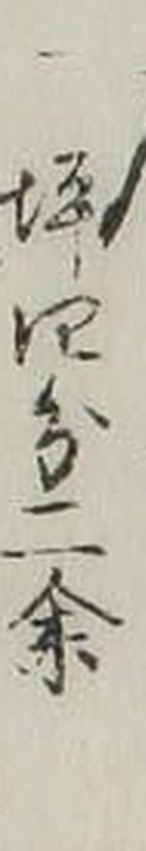四八坪四分二余
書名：宝玉塵劫記
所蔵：東京学芸大学教育コンテンツアーカイブ
